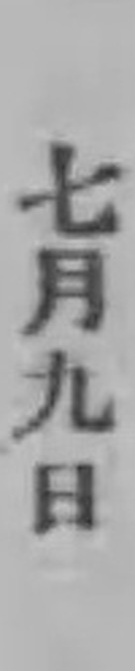七月九日
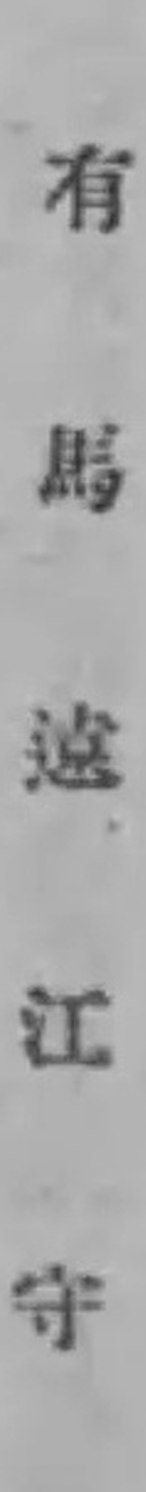有馬遠江守
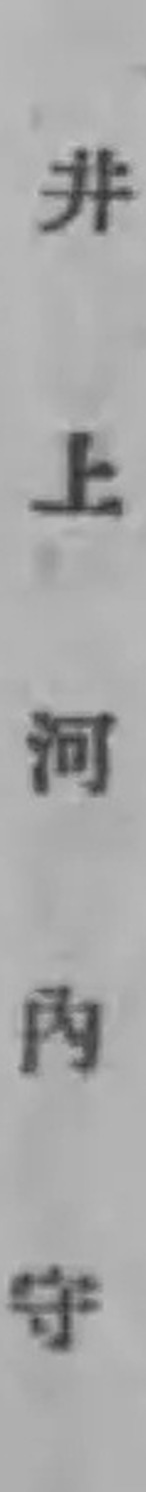井上河内守
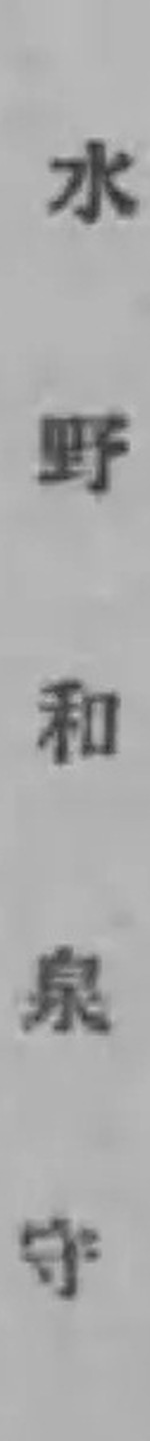水野和泉守
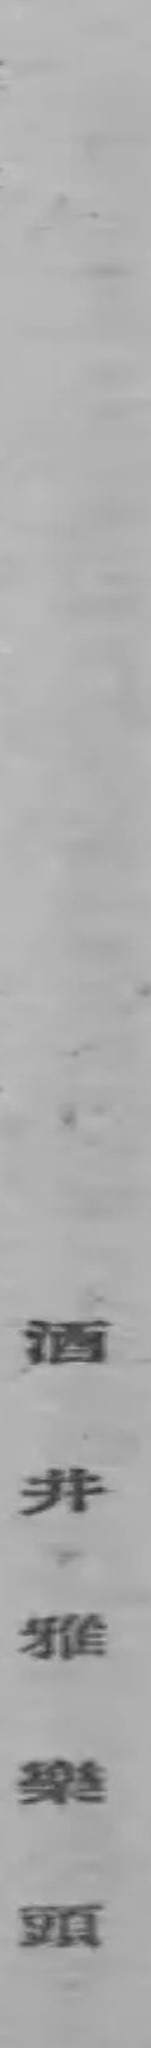酒井雅樂頭
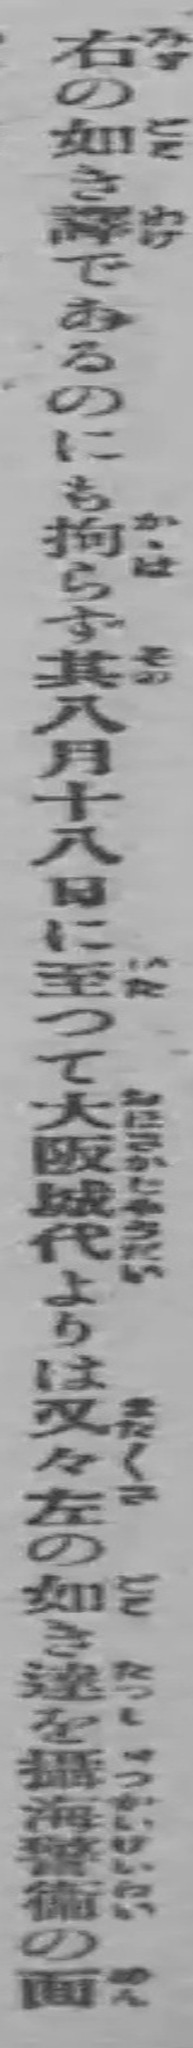右の如き訳であるのにも拘らず其八月十八日に至つて大阪城代よりは又々左の如き達を摂海警衛の面
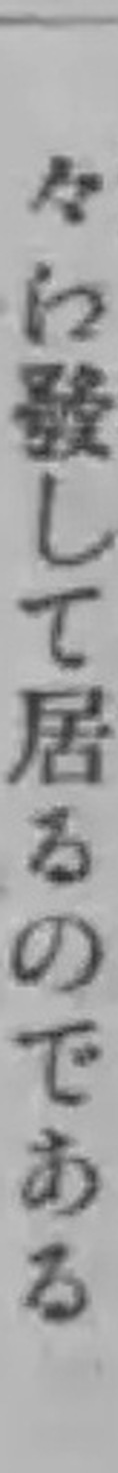面え発して居るのである
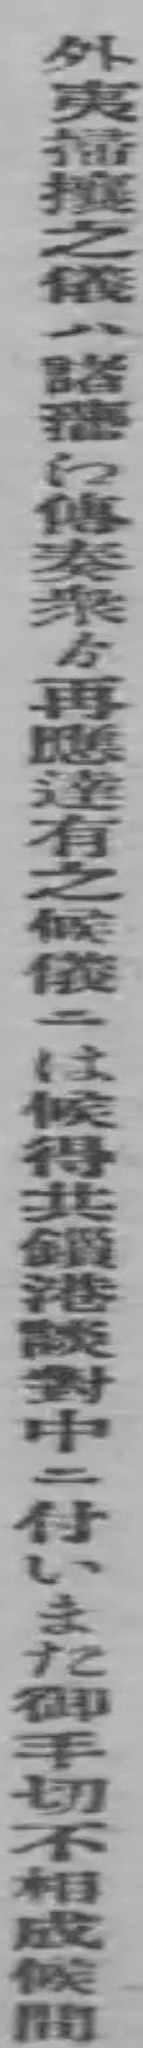外夷掃攘之儀ハ緒藩え伝奏衆ゟ再応達有之候儀ニは候得共鎖港談判中ニ付いまた御手切不相成候間
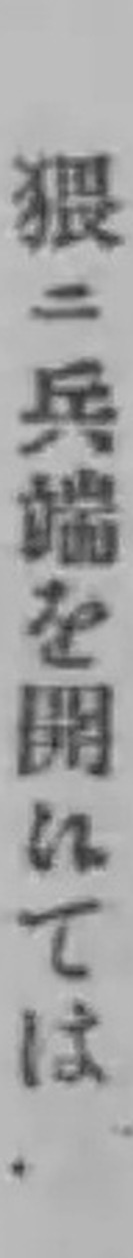猥ニ兵端を開候ては
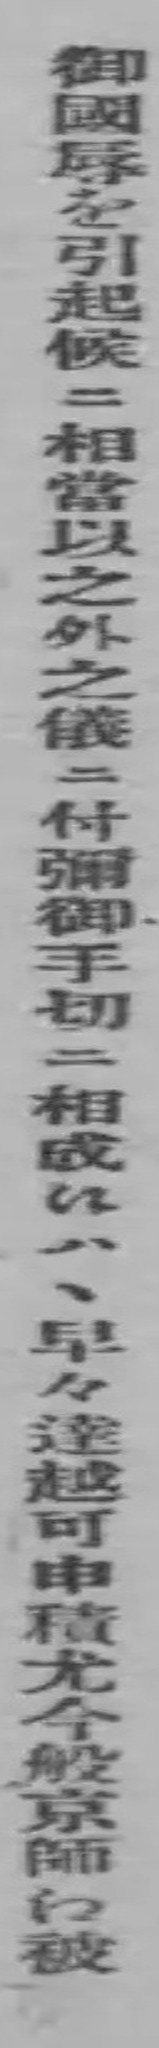御国辱を引起候ニ相当以之外之儀ニ付彌御手切ニ相成候ハヽ早々達越可申積尤今般京師え被
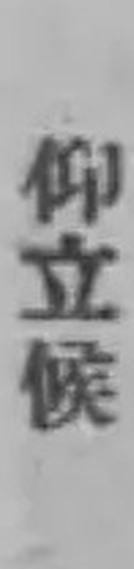仰立候
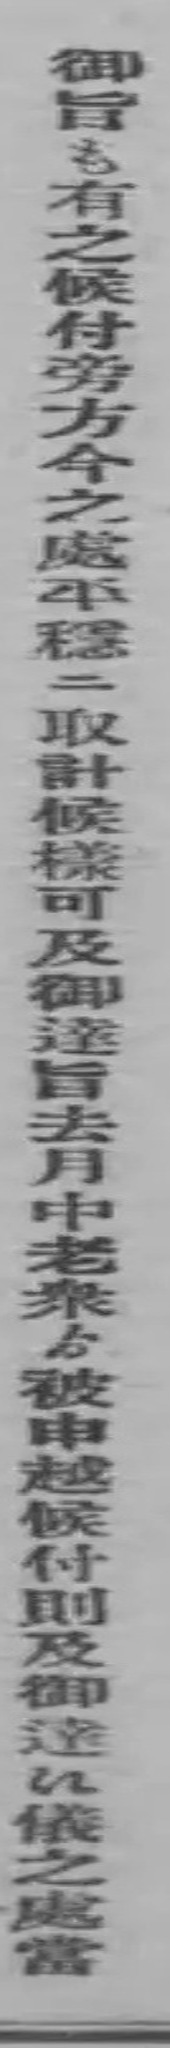御旨も有之候付旁方今之処平穏ニ取計候様可及御達旨去月中老衆ゟ被申越候付則及御達候儀之処当
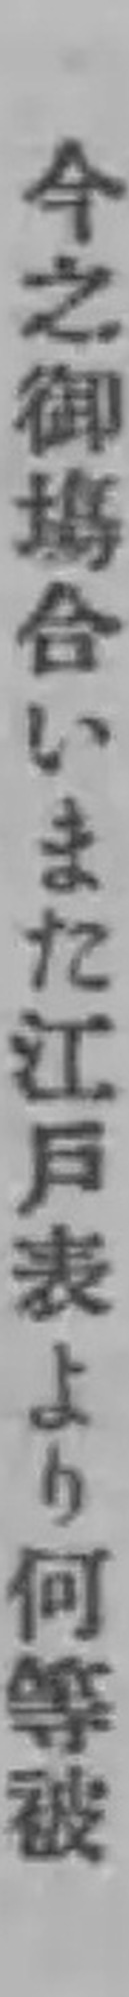今之御場合いまた江戸表より何等被
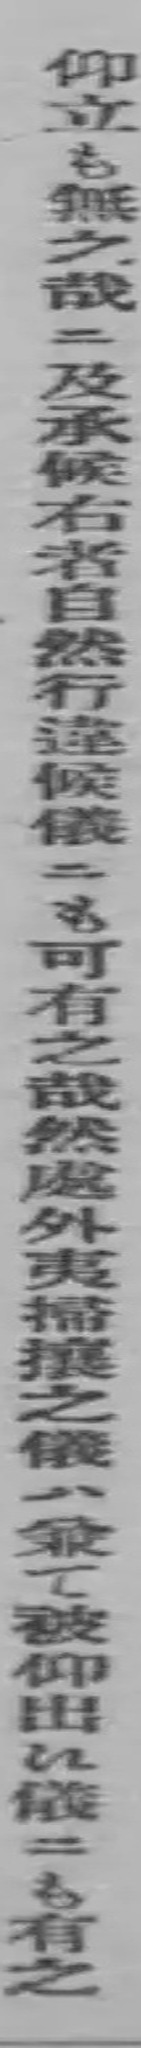仰立も無之哉ニ及承候右者自然行違候儀ニも可有之哉然処外夷掃攘之儀ハ兼て被仰出候儀ニも有之
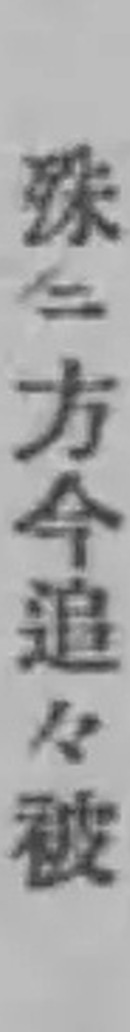殊ニ方今追々被
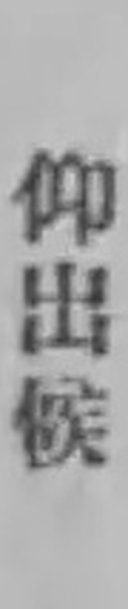仰出候
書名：豊橋市史談
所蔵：国立国会図書館 National Diet Library, JAPAN
